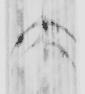大
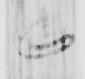㠯（以）
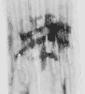不
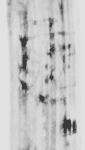{龍廾}
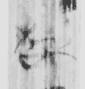和
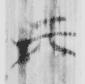亓
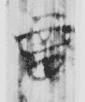音
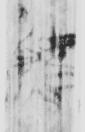{既火}
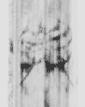與
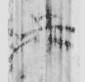亓
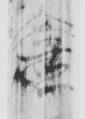{产色}
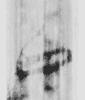㠯（以）
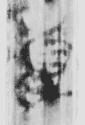{月頁}
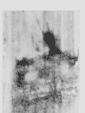之
